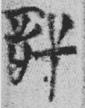訐
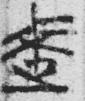○（來）
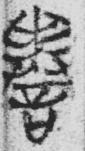譽
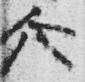六
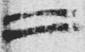二
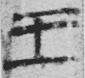王
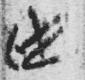臣
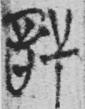訐訐
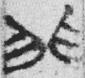非
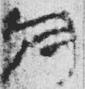今
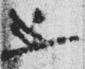之
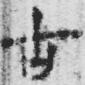古（故）
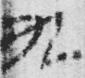九
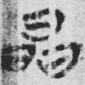晶
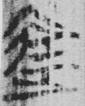○（往）
